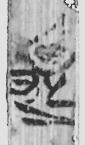{日止頁}（夏）
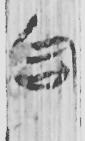句
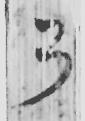乃
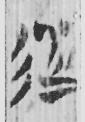從
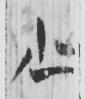少
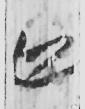臣
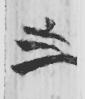之
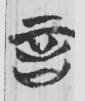言
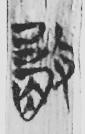{呂𠀬攴}
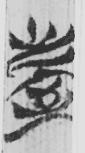{鹿至}
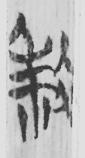殺
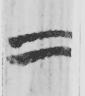二
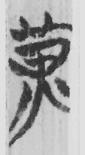黃
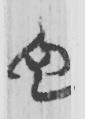它
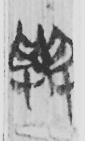與
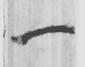一
